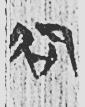卲
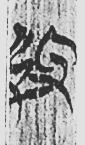{弓夬}
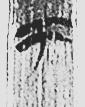于
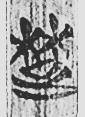楚
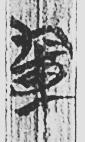軍
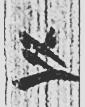之
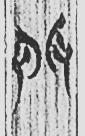門
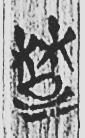楚
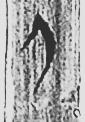人
